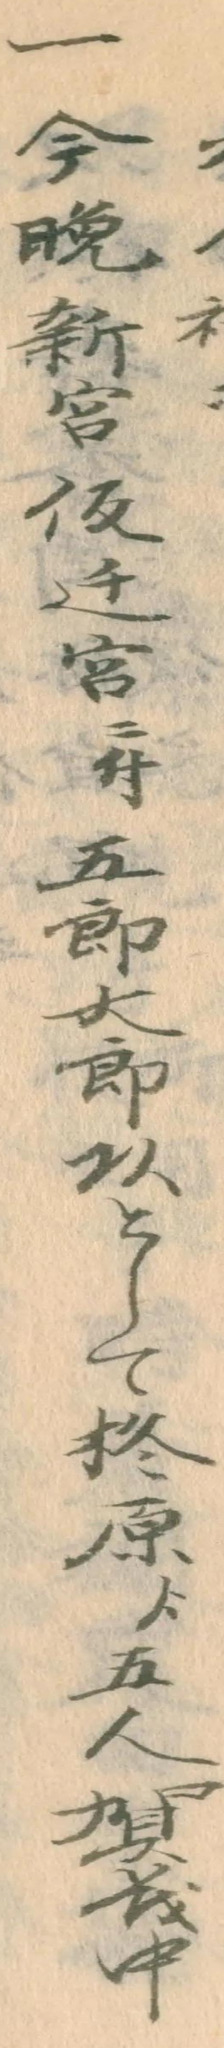一今晩新宮仮迁宮ニ付五郎太郎頭として柊原ゟ五人ニ賀茂中
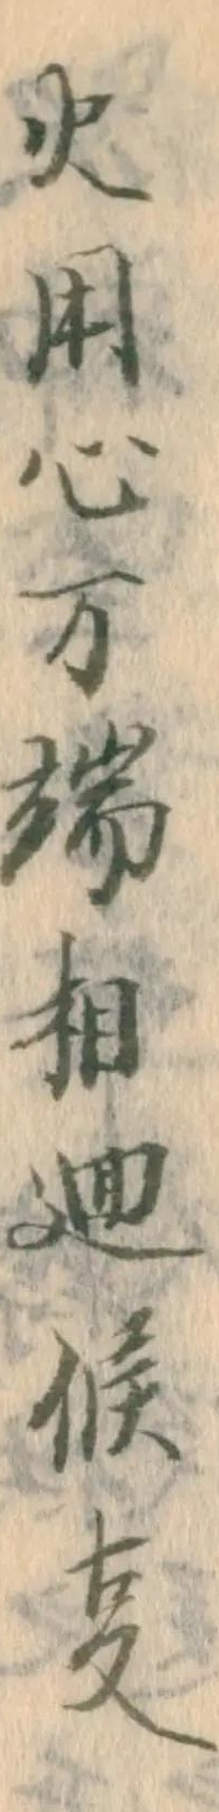火用心万端相廻候事
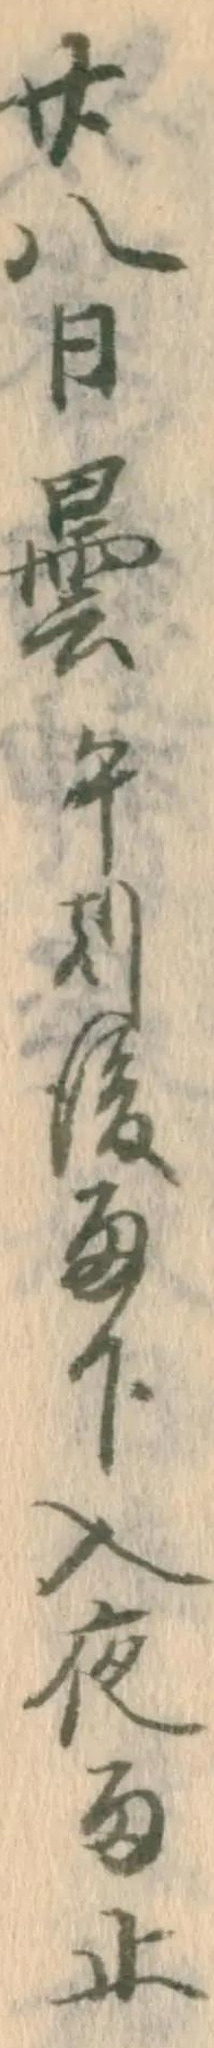廿八日曇午刻後雨下入夜雨止
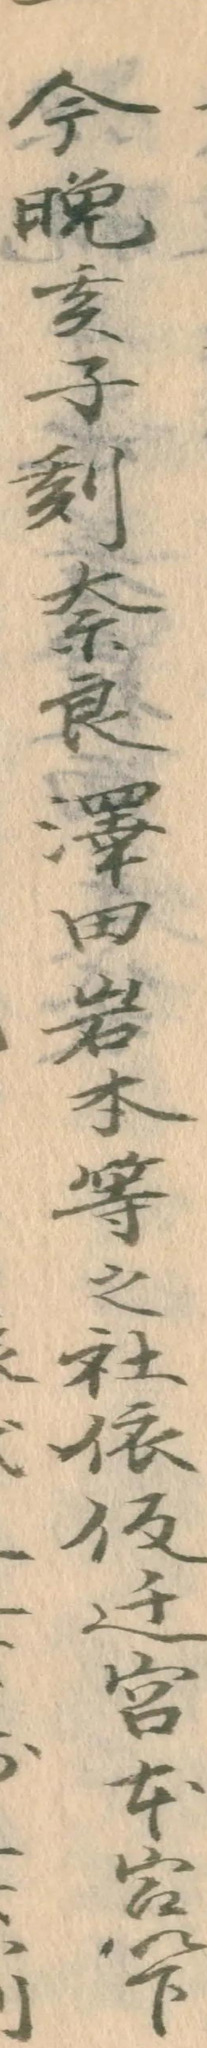一今晩亥子刻奈良沢田岩本等之社依仮迁宮本宮以下
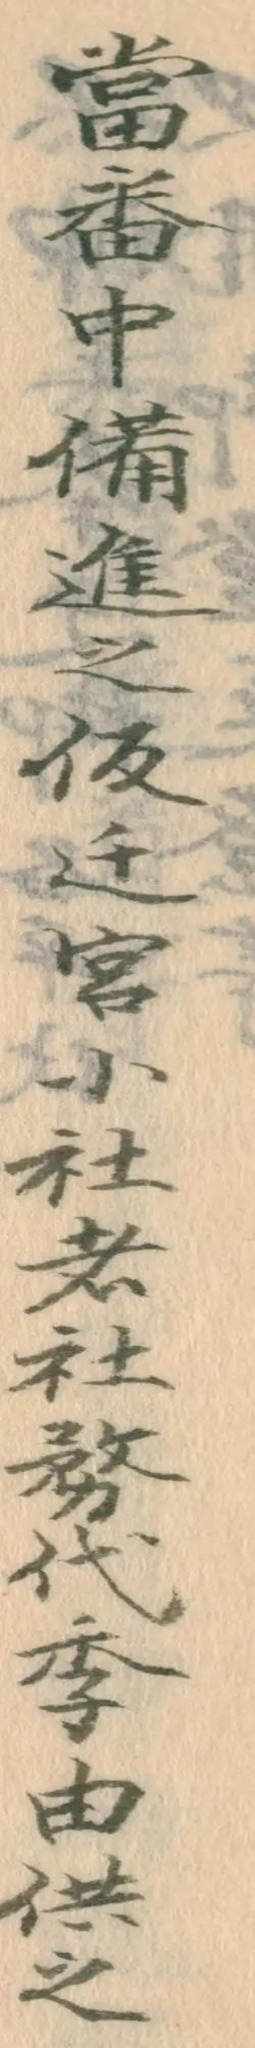当番中備進之仮迁宮小社者社務代季由供之
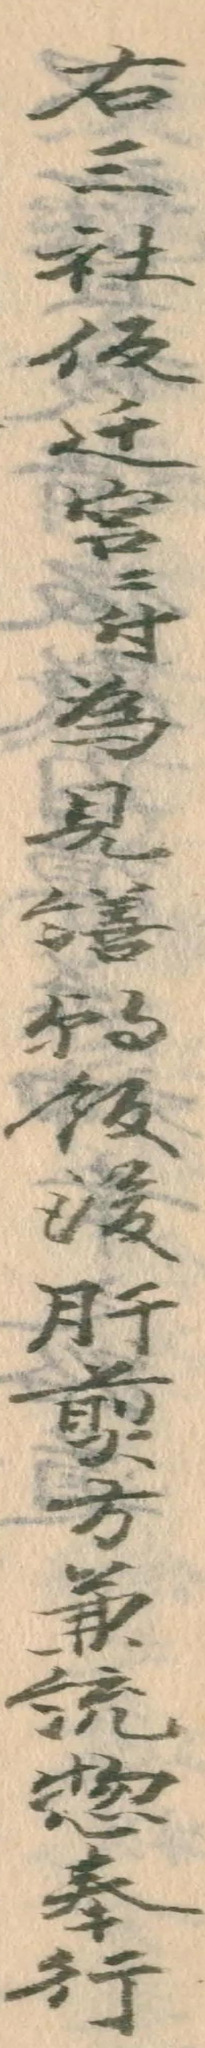一右三社仮迁宮ニ付為見繕朝飯後肝煎方兼統惣奉行
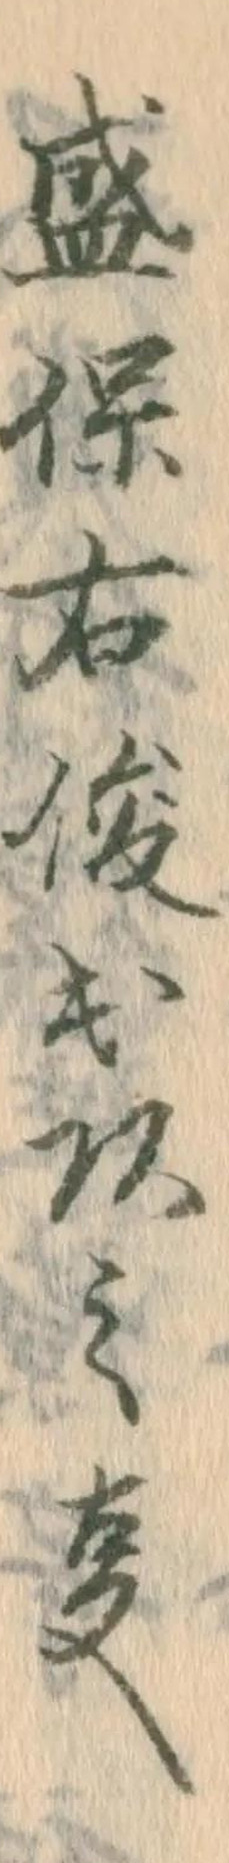盛保右俊出頭之事
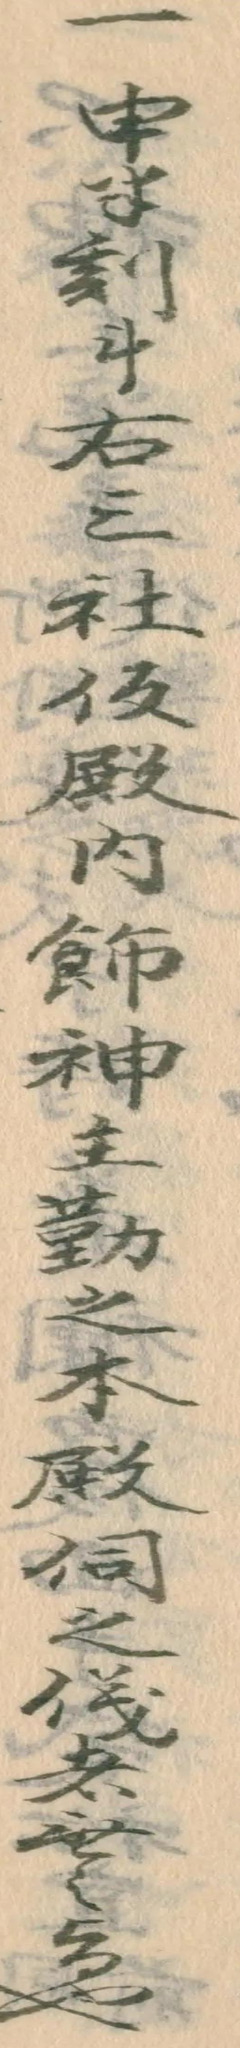一申半刻計右三社仮殿内飾神主勤之本殿伺之儀者無之旨也
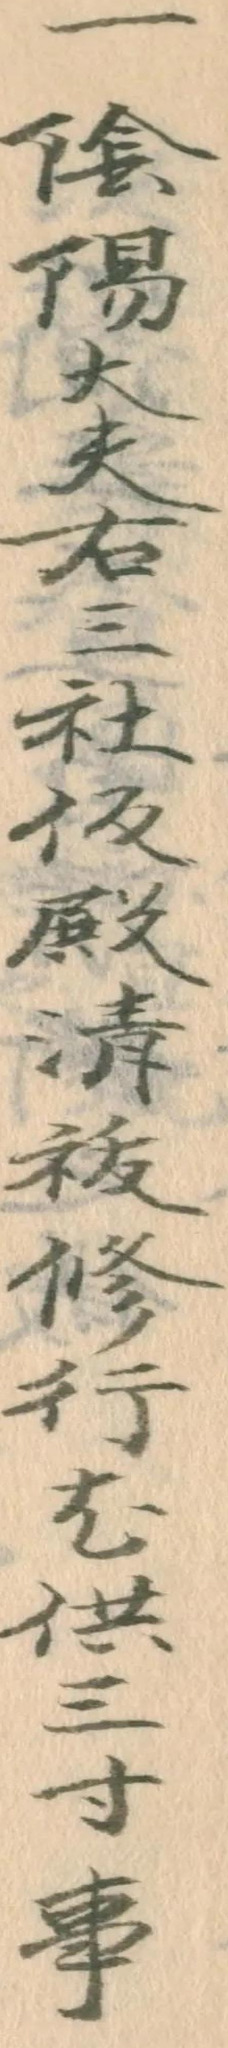一陰陽大夫右三社仮殿清祓修行尤供三寸事
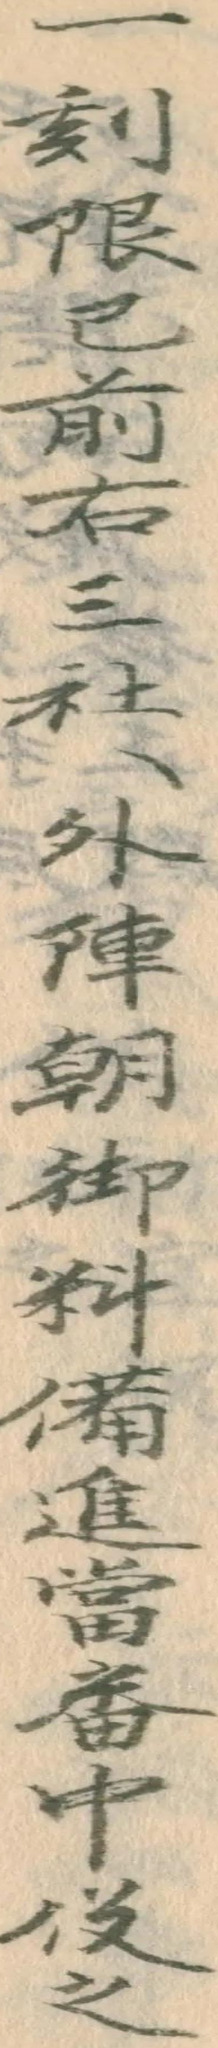一刻限已前右三社へ外陣朝御料備進当番中役之
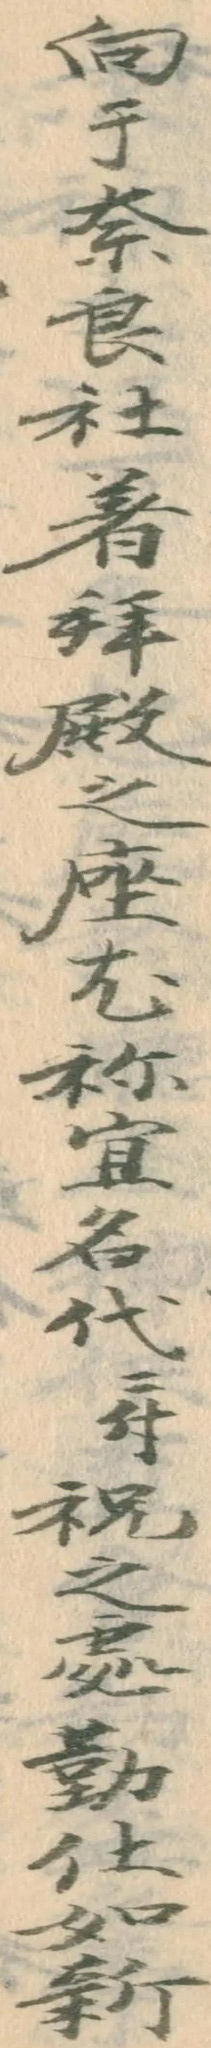向于奈良社着拝殿之座尤祢宜名代ニ付祝之処勤仕如新
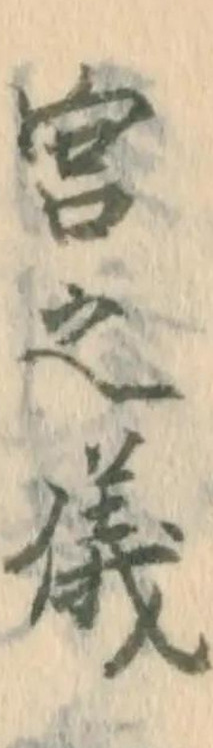宮之儀
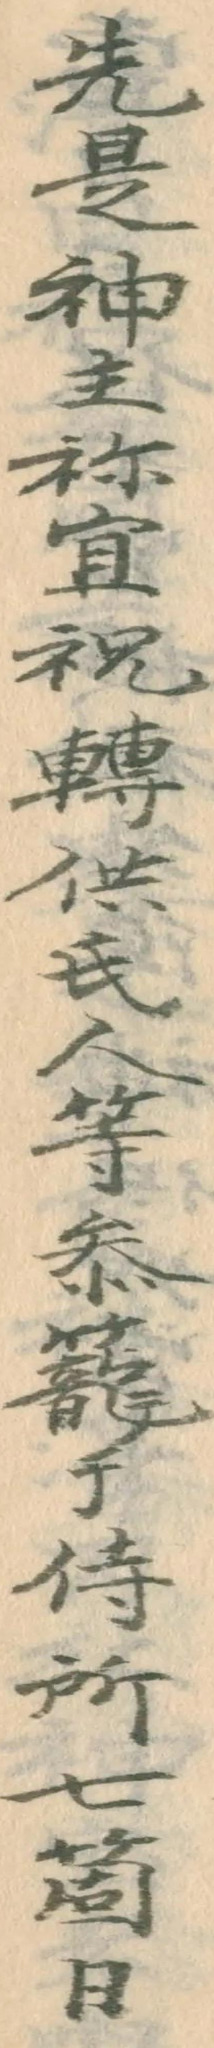先是神主祢宜祝転供氏人等参籠于侍所七箇日

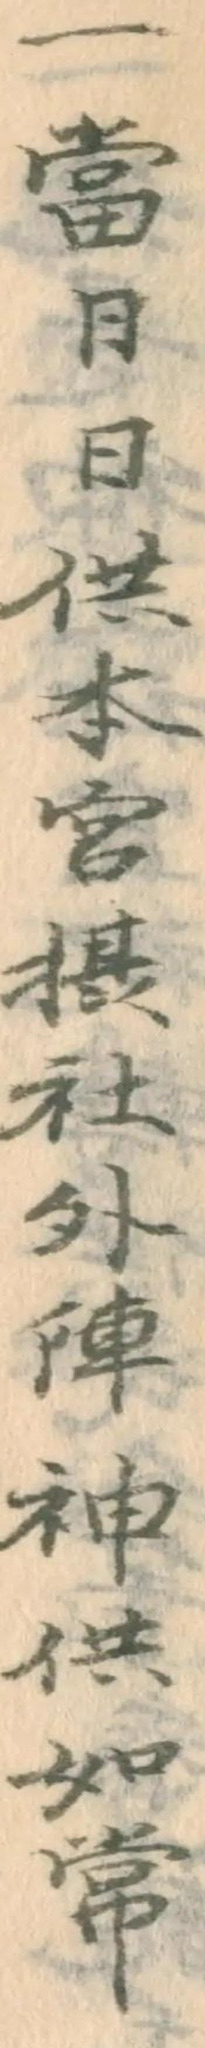一当日日供本宮摂社外陣神供如常
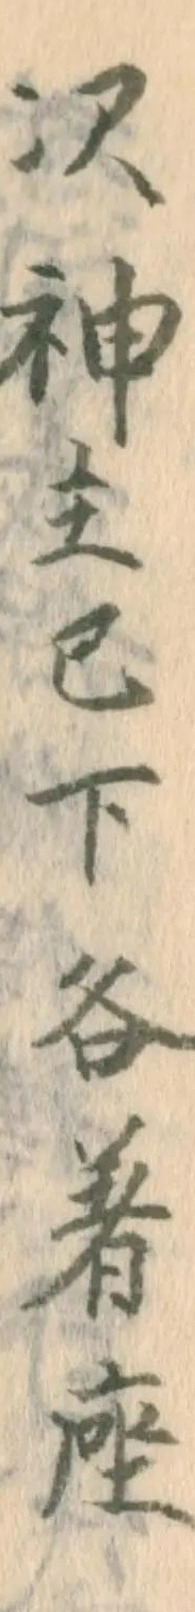次神主巳下各着座
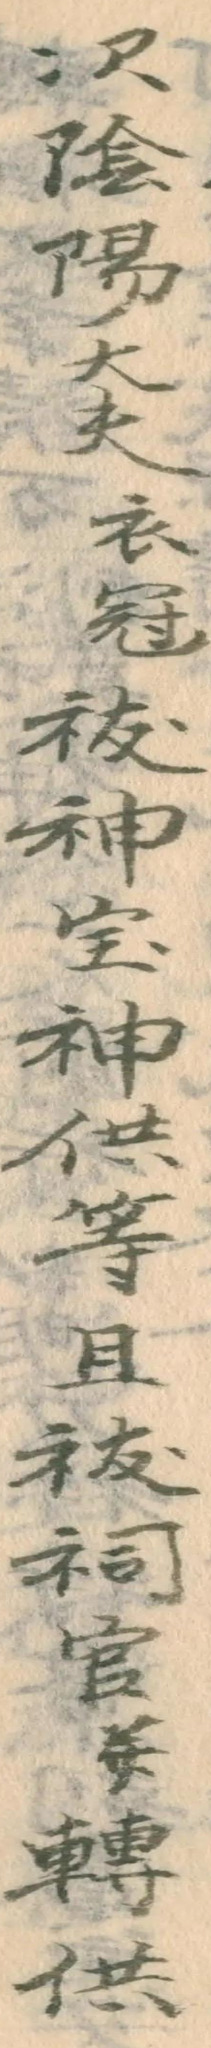次陰陽大夫衣冠祓神宝神供等且祓祠官并転供
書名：賀茂社記録. 第17冊
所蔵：国立国会図書館 National Diet Library, JAPAN
